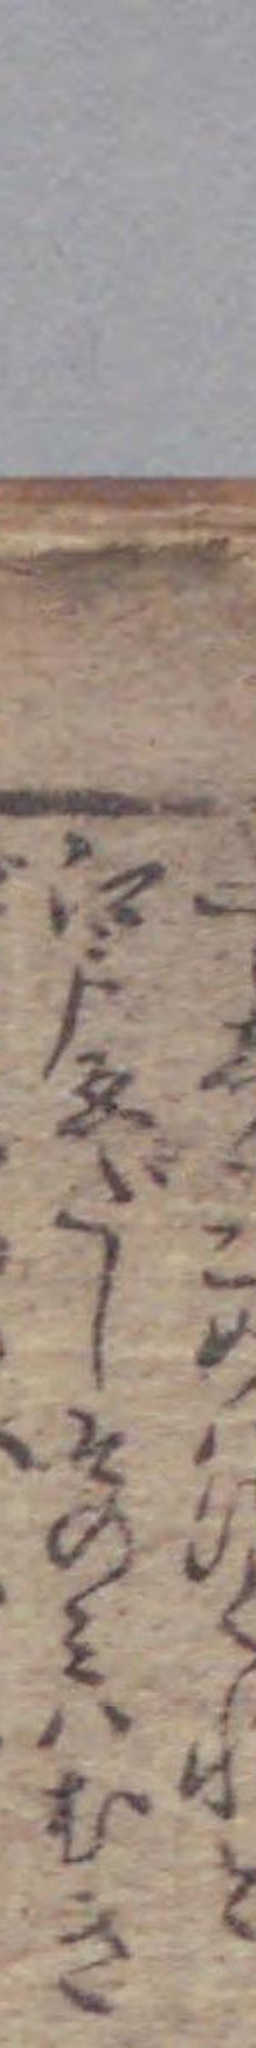江戸ゑだしそのみはむき
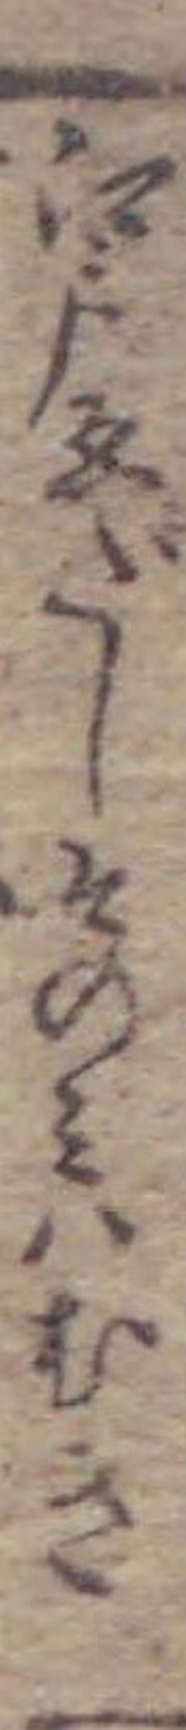江戸ゑだしそのみはむき
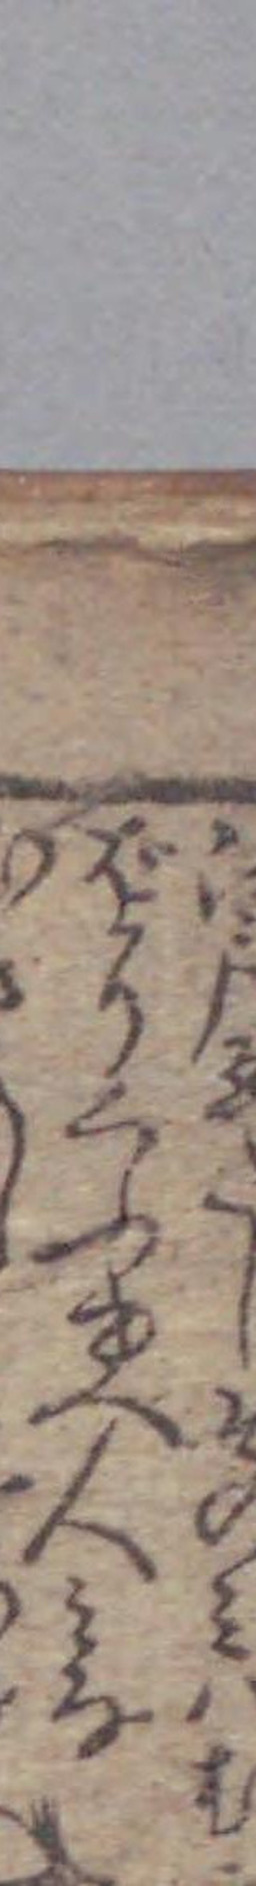ばかりくふゆへ人みな
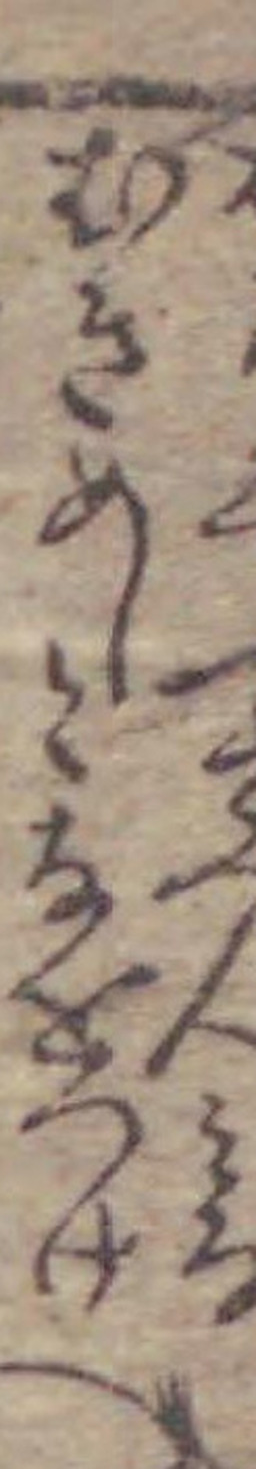むきめしとなをつけ
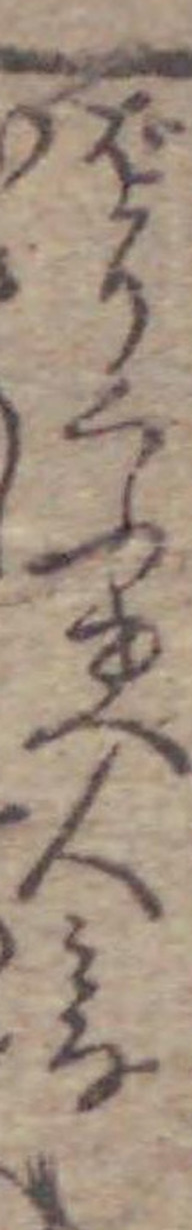ばかりくふゆへ人みな
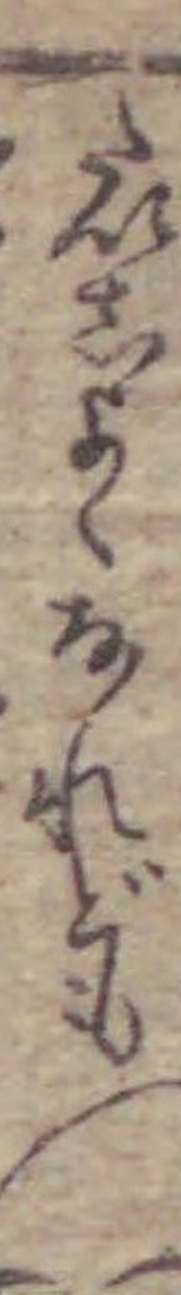たいしよくなれども
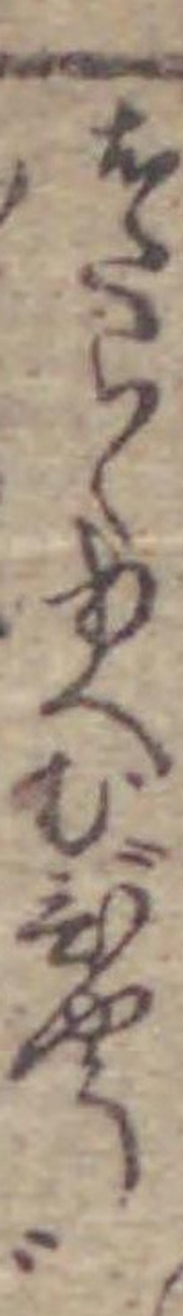はたらくゆへむびやう
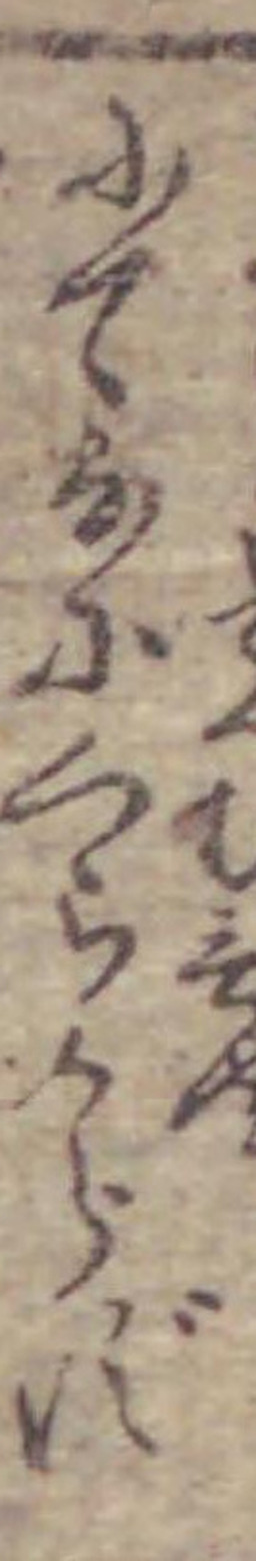にてなにくらからず
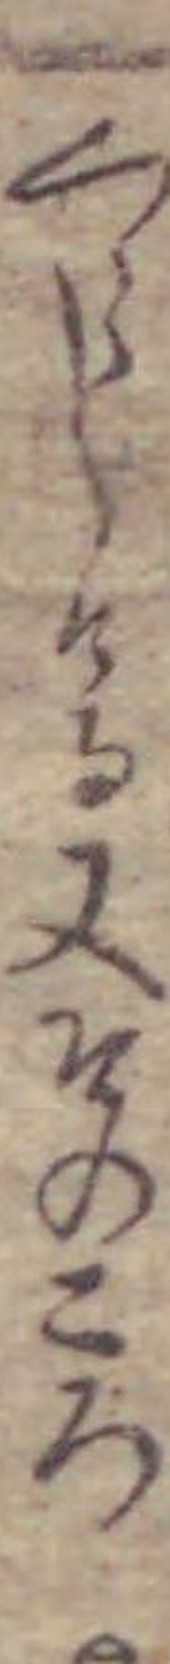くらしける又そのころ
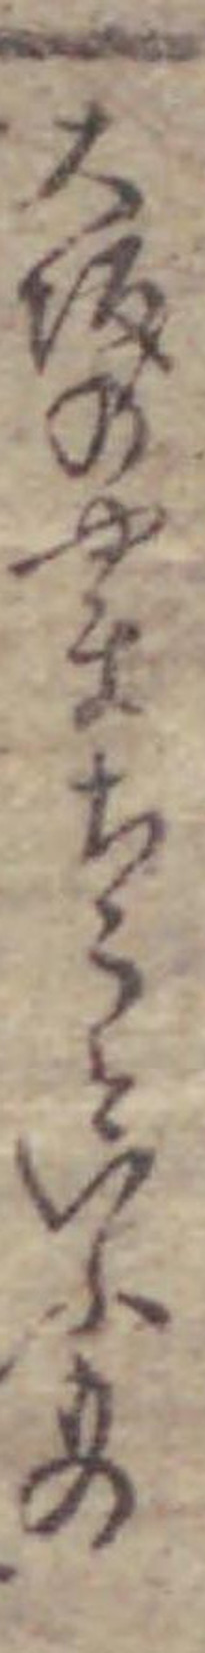大坂のやまちうといふもの
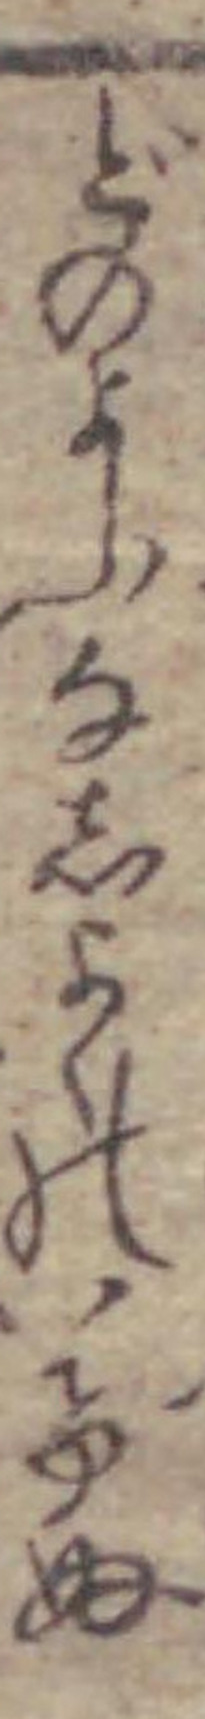どのよふなしよくのいけぬ
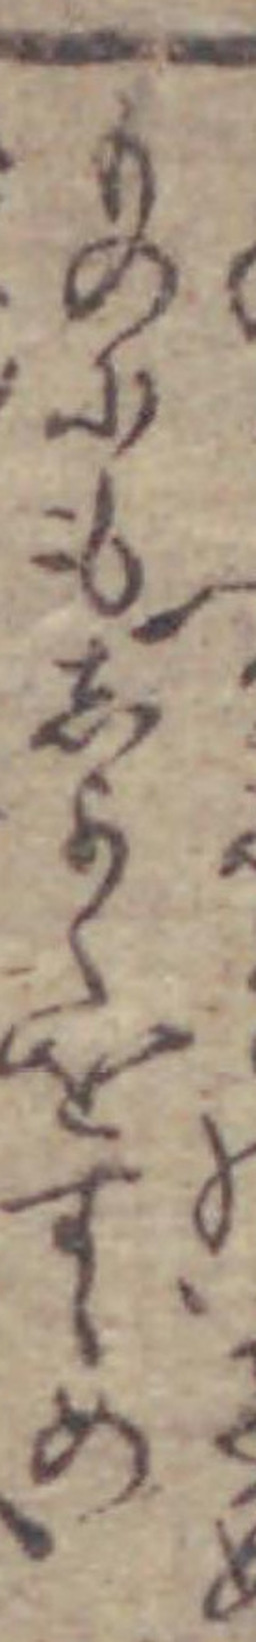ものにもしよくをすゝめ
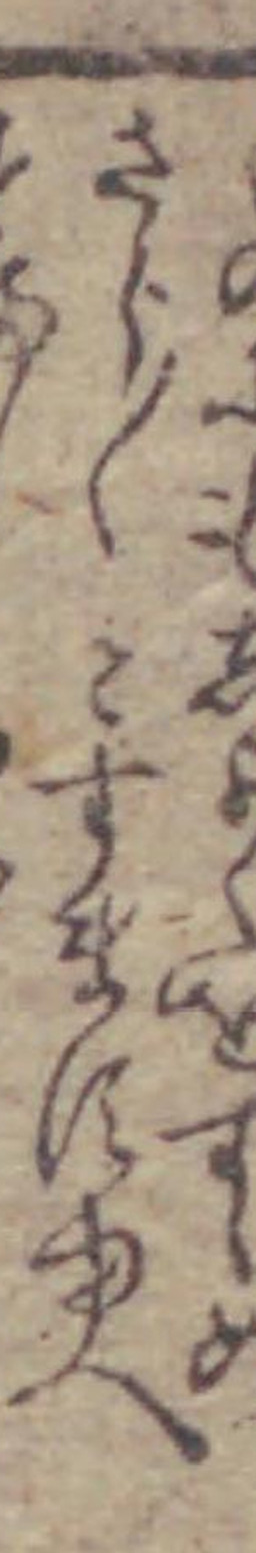さら〳〵とすますゆへ
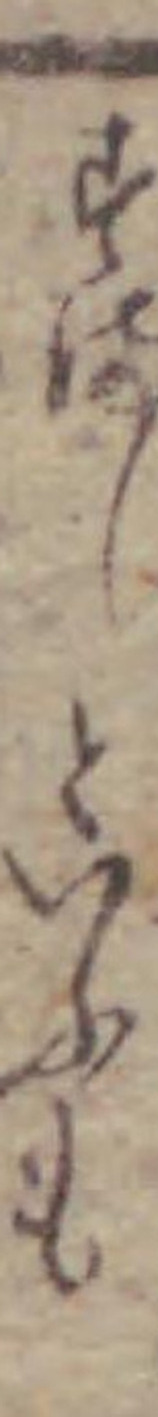すましといふも
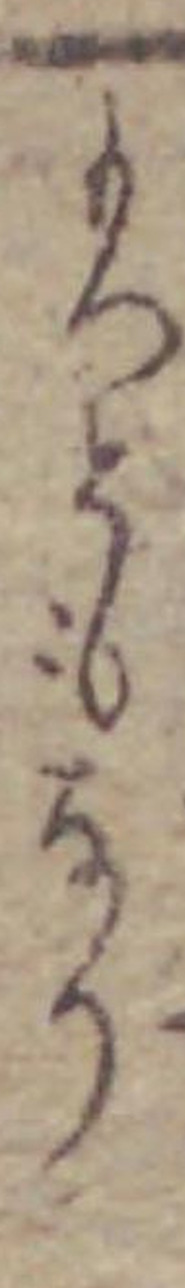もつともなり
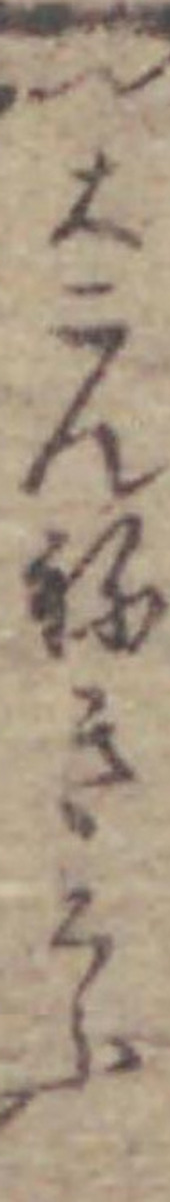〽大こんねきとふ
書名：諸事米の飯 : 3巻
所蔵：国立国会図書館 National Diet Library, JAPAN
